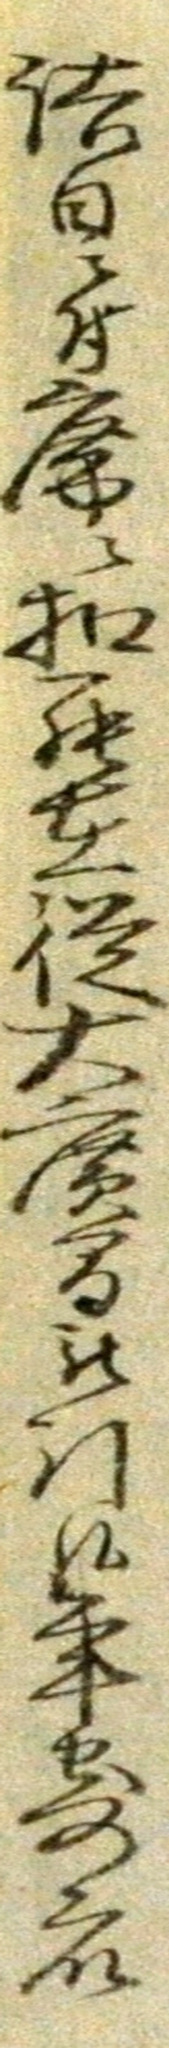詰日ニ付席ニ扣罷在従大広間被引候年寄衆
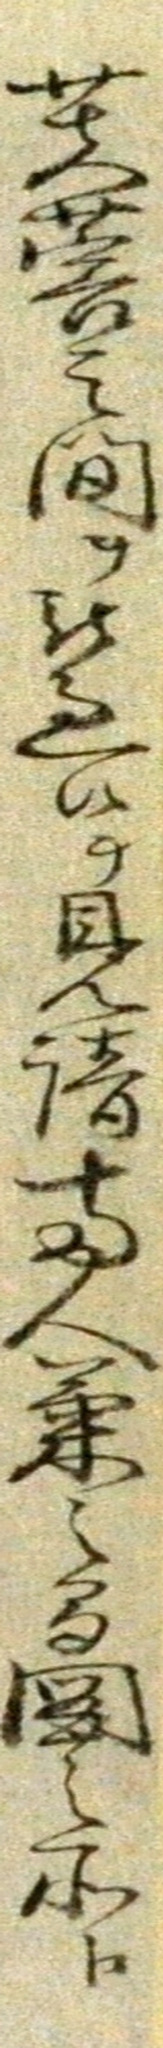芙蓉之間ヲ被過候ヲ見請両人菊之間図之所え
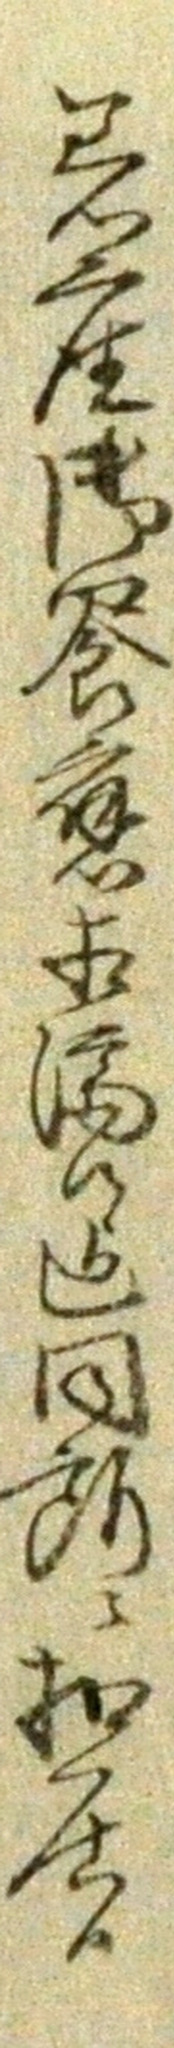着座御饗応相済候迄同所ニ扣居候
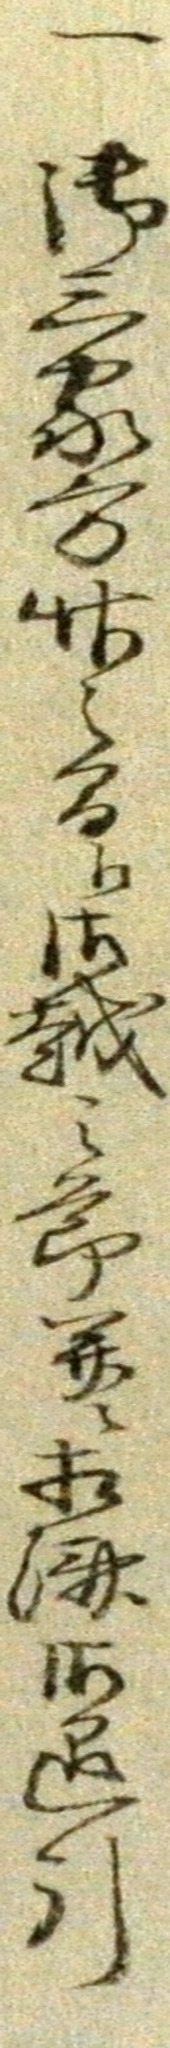一御三家方竹之間え御越之節并ニ相済御退引
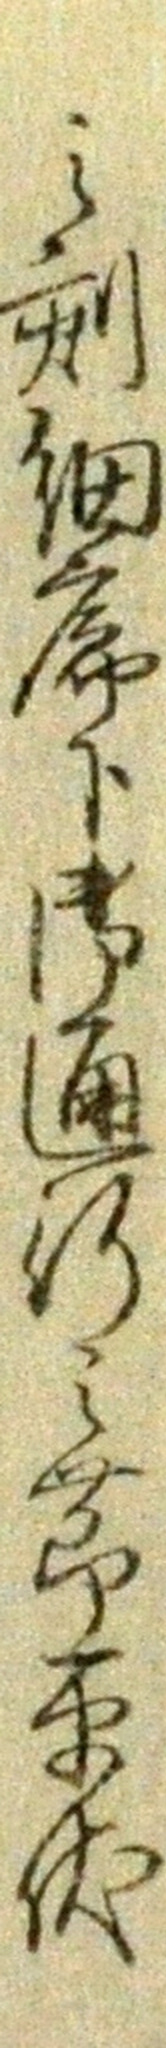之刻細廊下御通行之節平伏
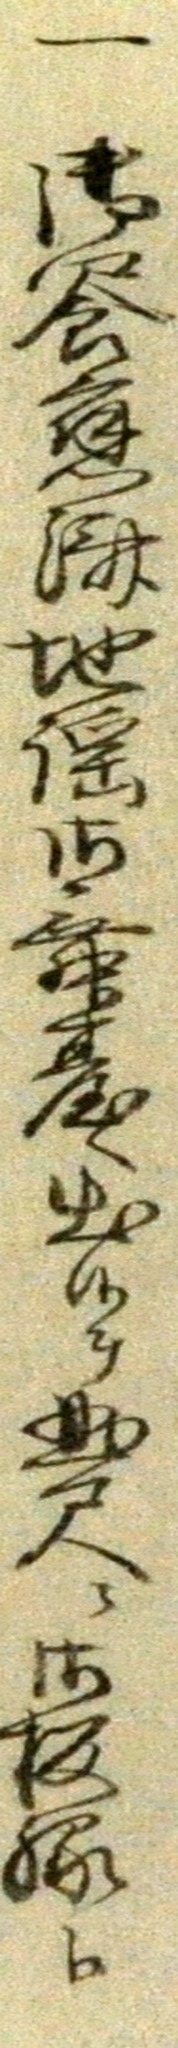一御饗応済地謡御舞台へ出候ヲ曲尺ニ御板縁え
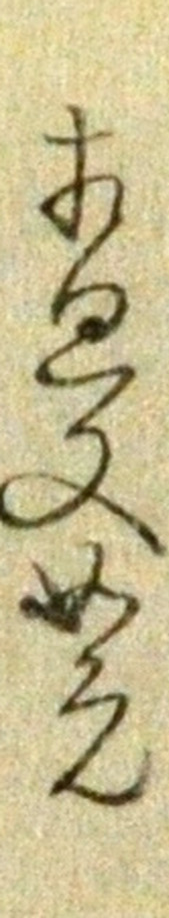相廻又如元
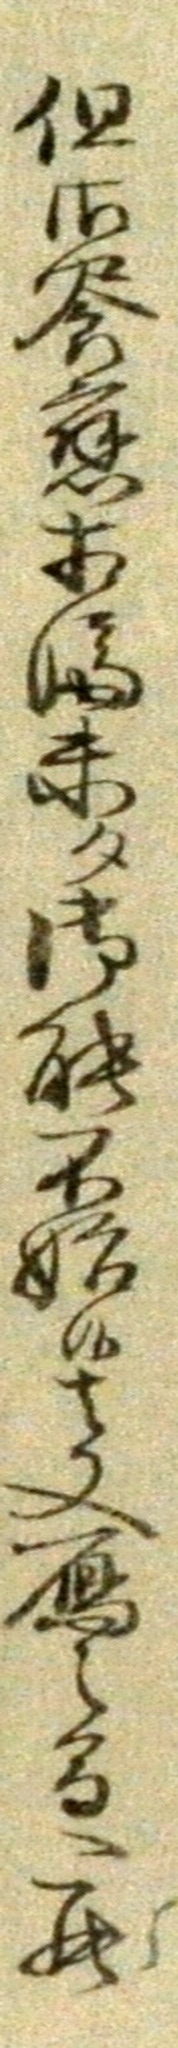但御饗応相済未タ御能不始候は又雁之間へ罷
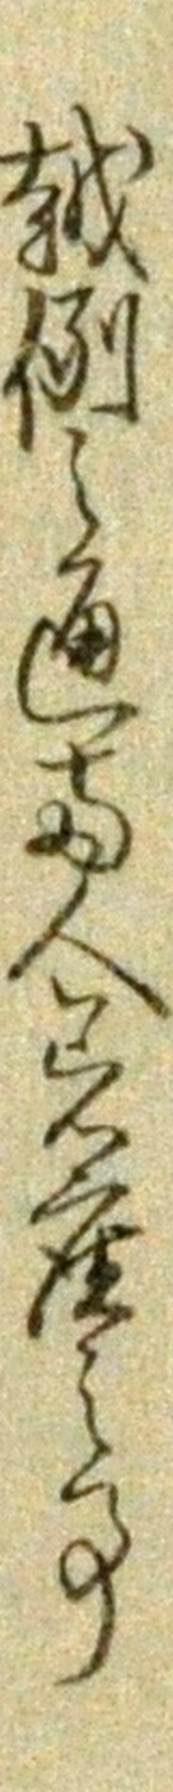越例之通両人着座之事
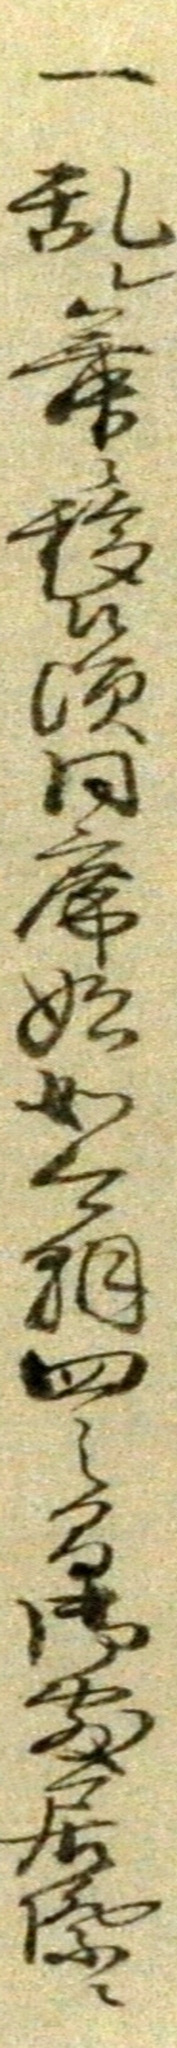一乱レ舞ニ移候頃同席始如今朝四之間御敷居際ニ
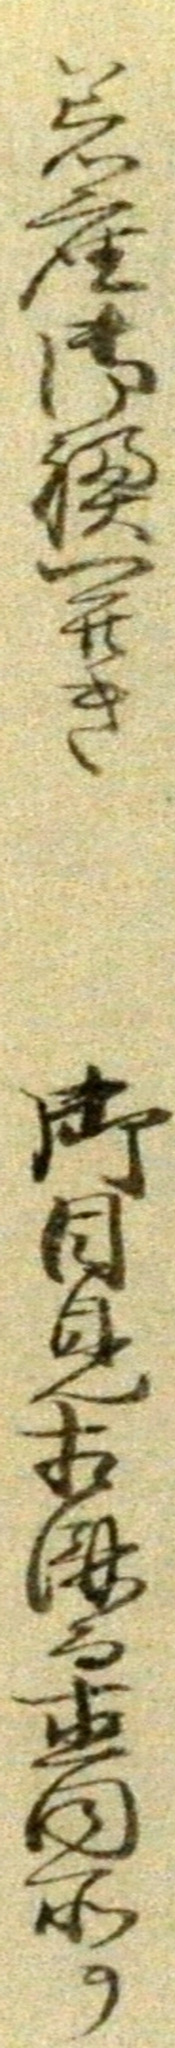着座御襖開き御目見相済而直同所ヲ
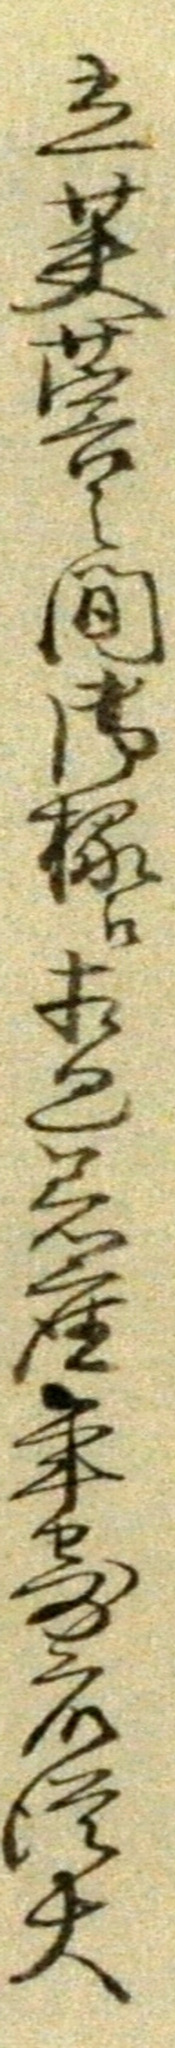立芙蓉之間御椽え相廻着座年寄衆従大
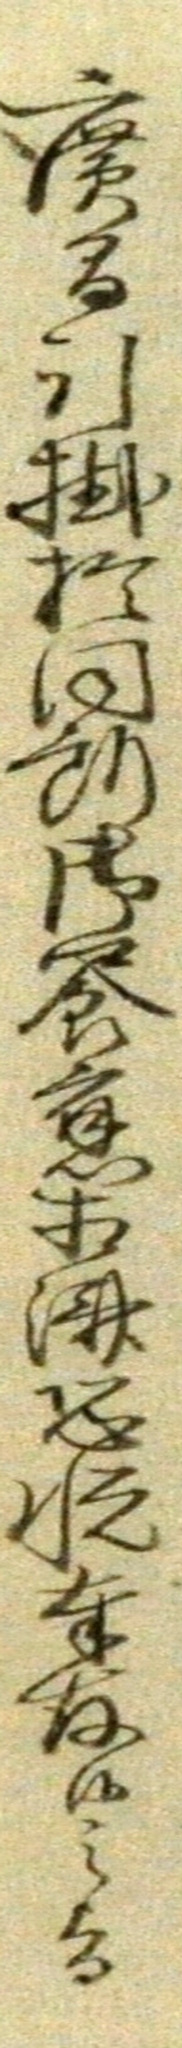広間引掛於同所御饗応相済恐悦奉存候之旨
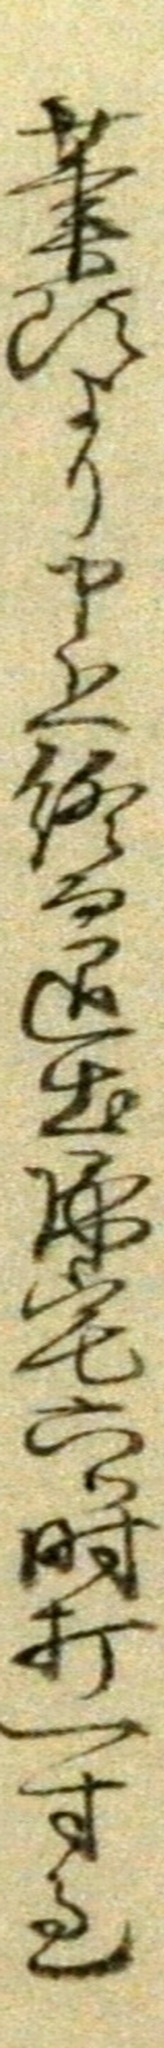筆頭より申上終而退出帰宅六ツ時打一寸過
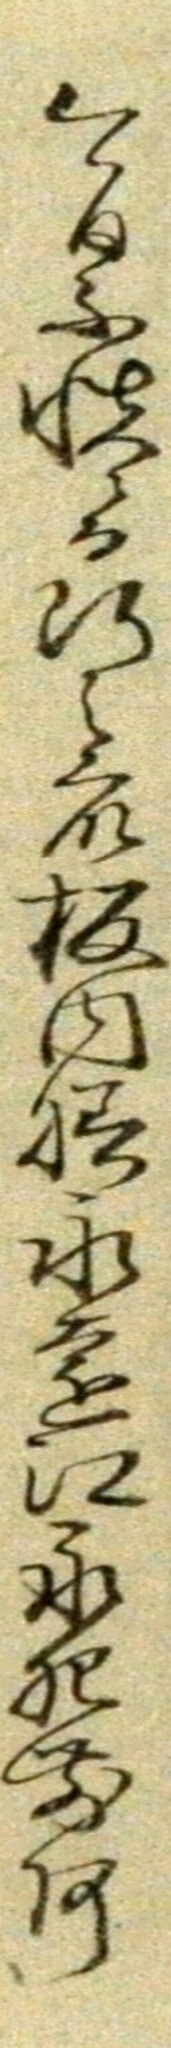今日不快ニ而断之衆板内膳永遠江永肥前阿
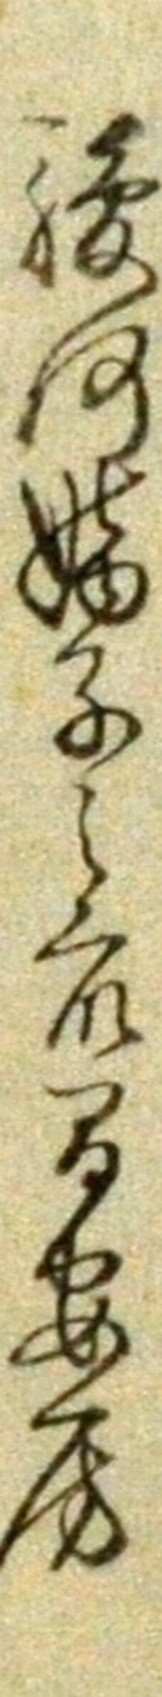駿河嫡子之衆間安房
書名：諸留書〔一括〕
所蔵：伊那市立高遠町図書館・合同会社AMANE
